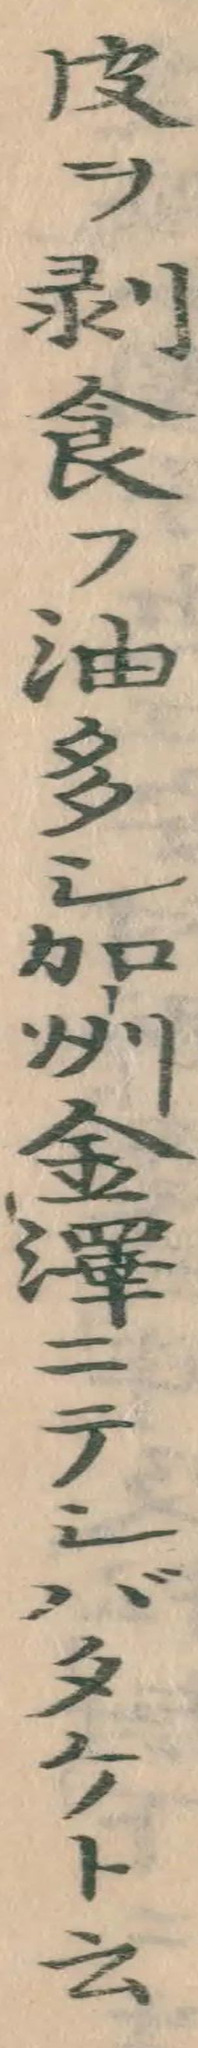皮ヲ剥食フ油多シ加州金沢ニテシバタケト云
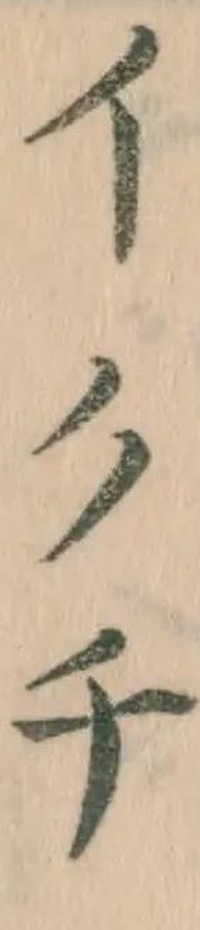イクチ
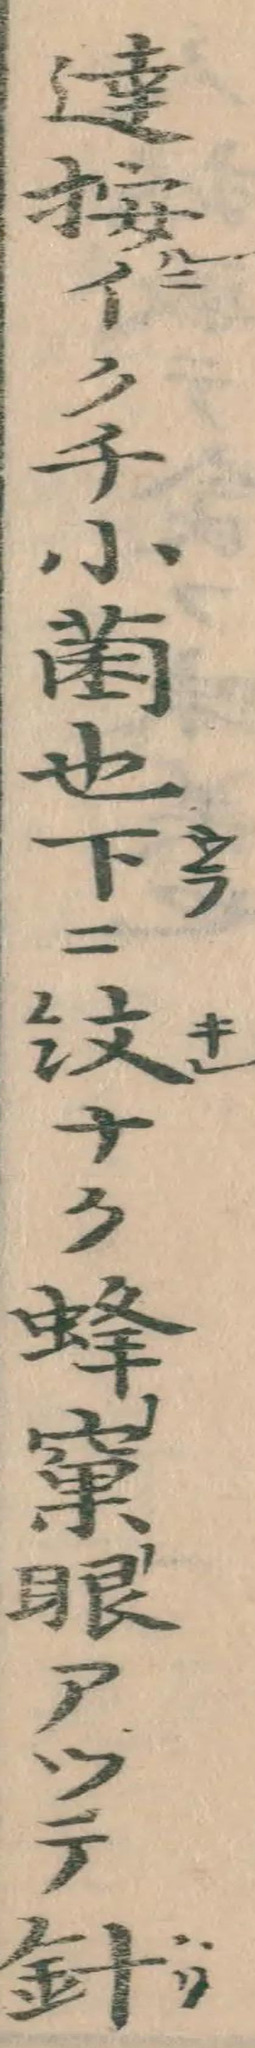達按イクチ小菌也下ニ紋ナク蜂窠眼アツテ針
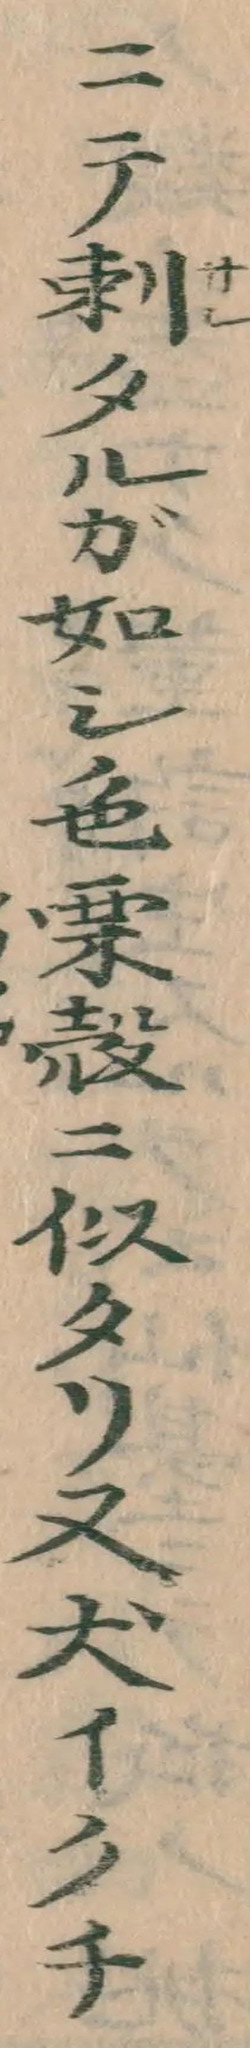ニテ刺タルガ如シ色栗殻ニ似タリ又犬イクチ
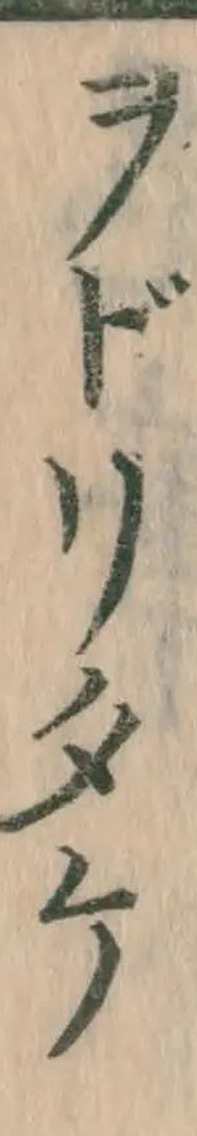ヲドリタケ
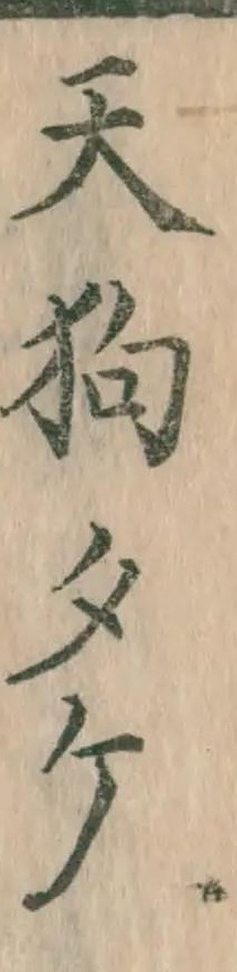天狗タケ
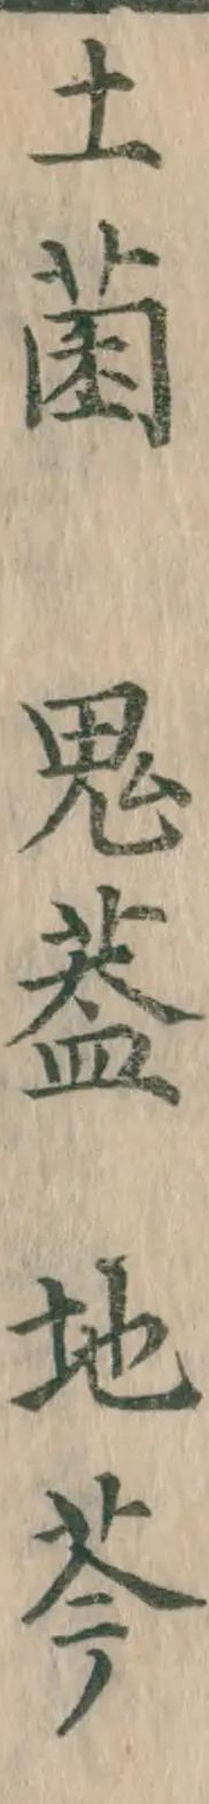土菌鬼蓋地芩
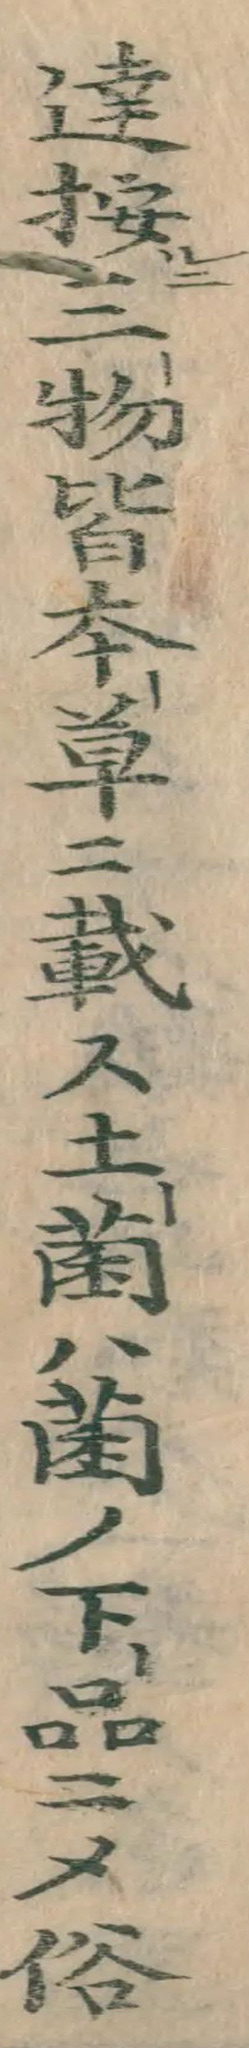達按三物皆本草ニ載ス土菌ハ菌ノ下品ニシテ俗

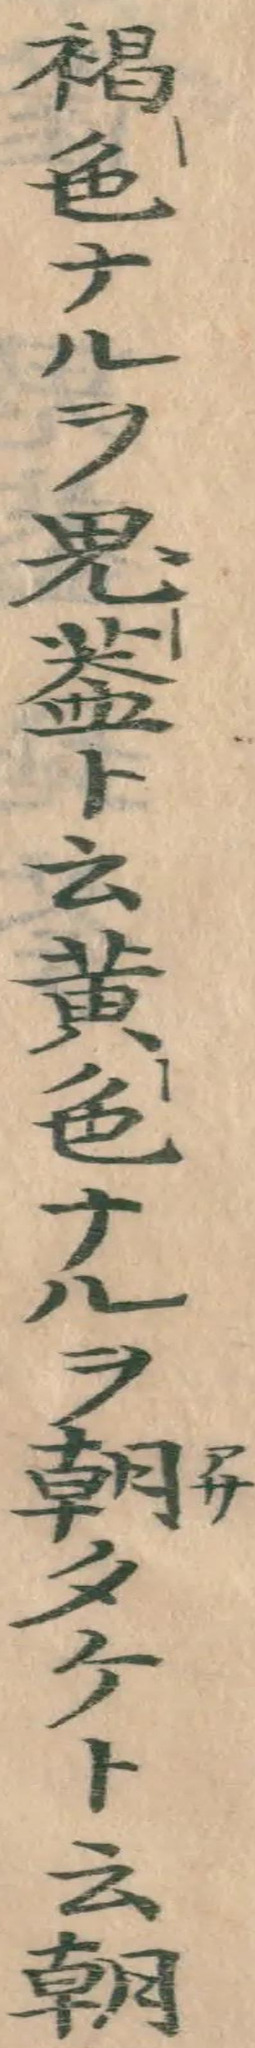褐色ナルヲ鬼蓋ト云黄色ナルヲ朝タケト云朝
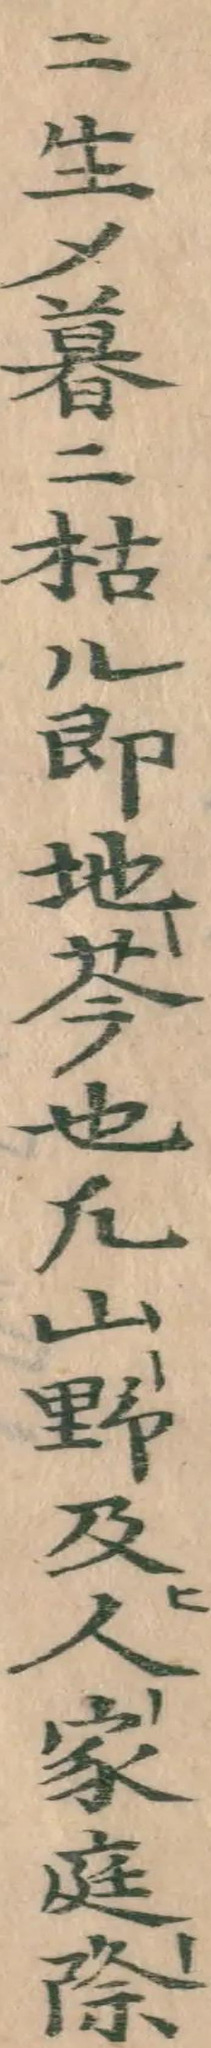ニ生シテ暮ニ枯ル即地芩也凡山野及人家庭際
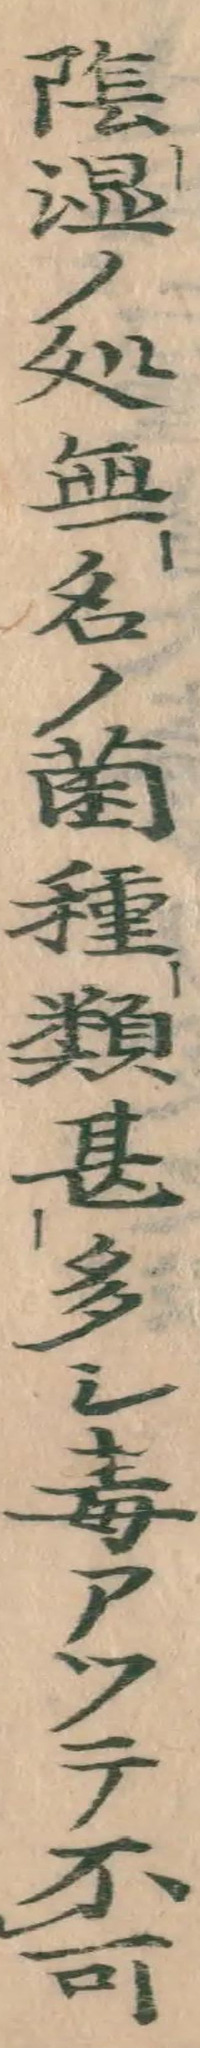陰湿ノ処無名ノ菌種類甚多シ毒アツテ不可
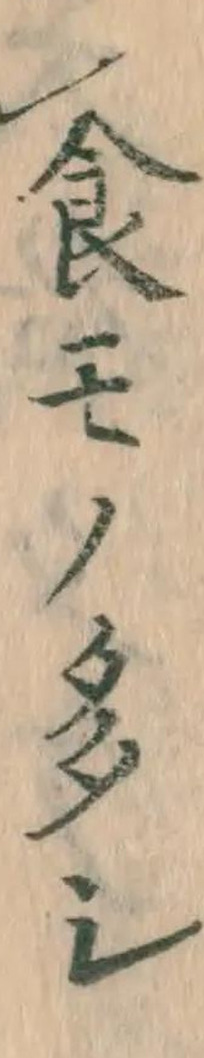食モノ多シ
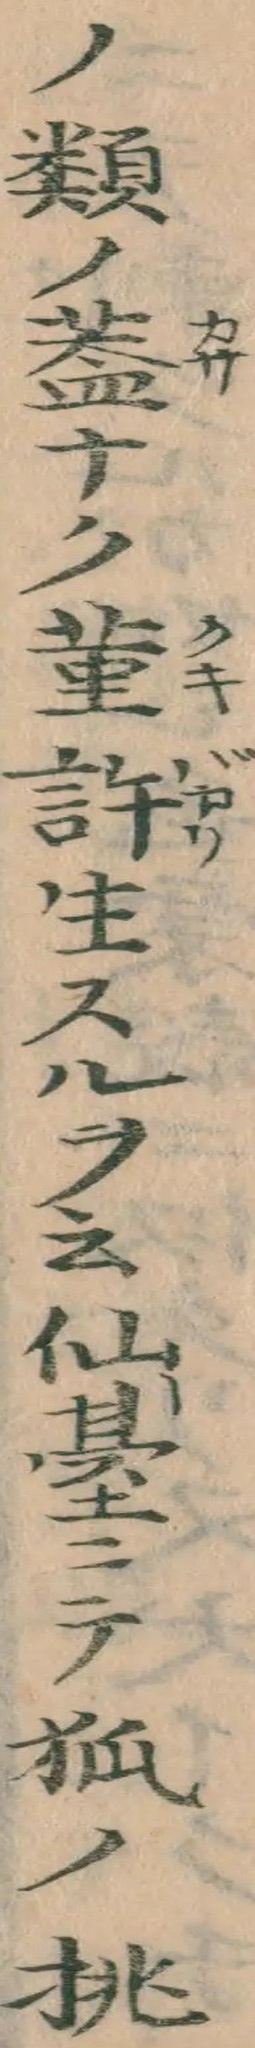ノ類ノ葢ナク茎許生スルヲ云仙台ニテ狐ノ挑
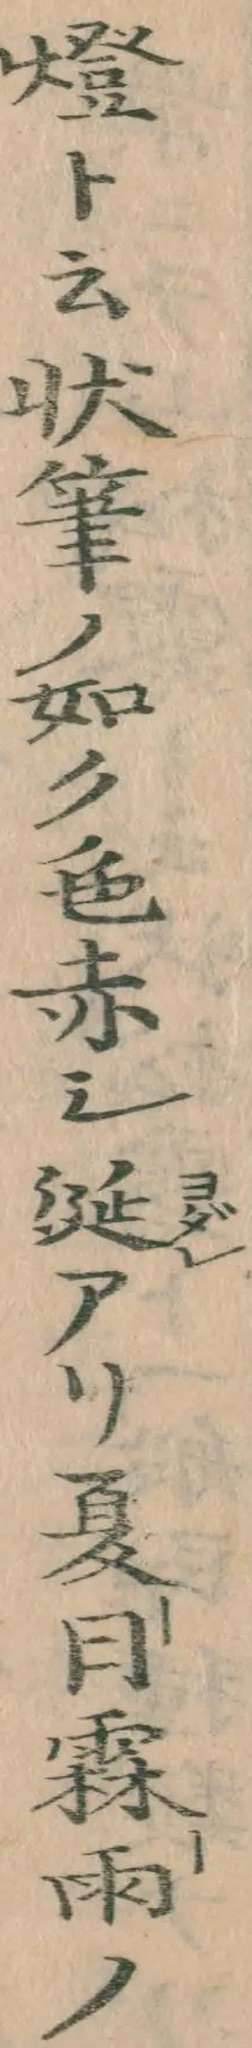燈ト云状筆ノ如ク色赤シ涎アリ夏月霖雨ノ
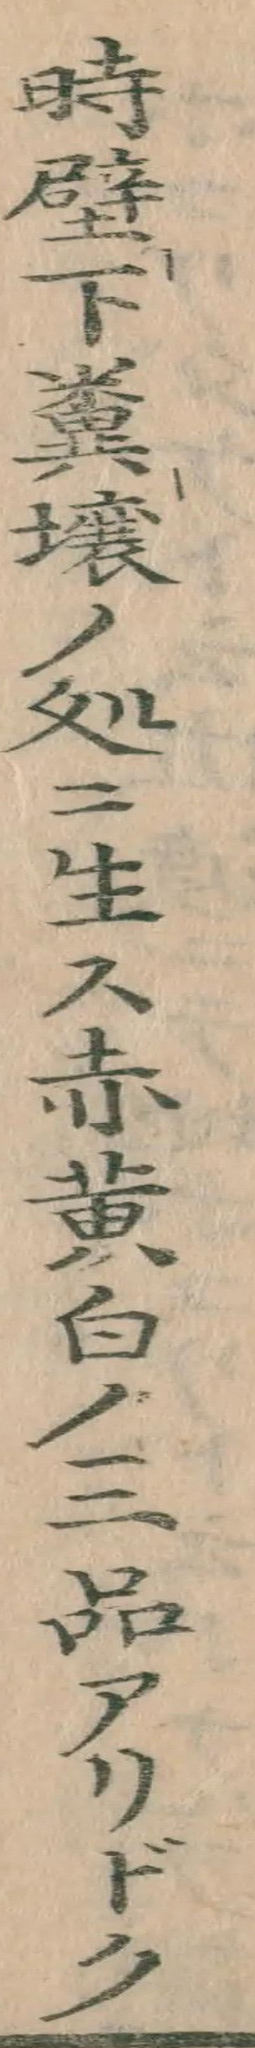時壁下糞壌ノ処ニ生ス赤黄白ノ三品アリドク
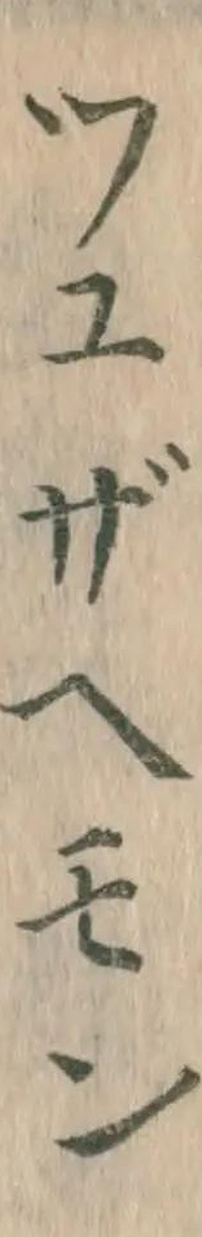ツユザヘモン
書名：怡顔斎菌品 2巻
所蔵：国立国会図書館 National Diet Library, JAPAN
